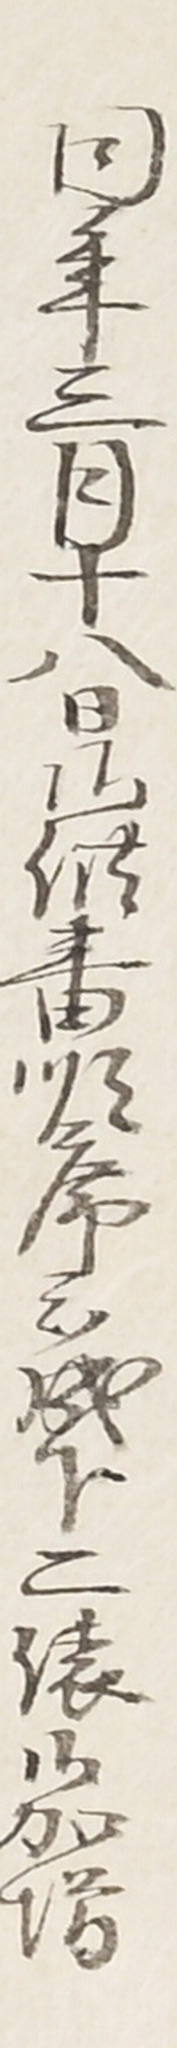一同年三月十八日御供番順席被成下二俵御加増
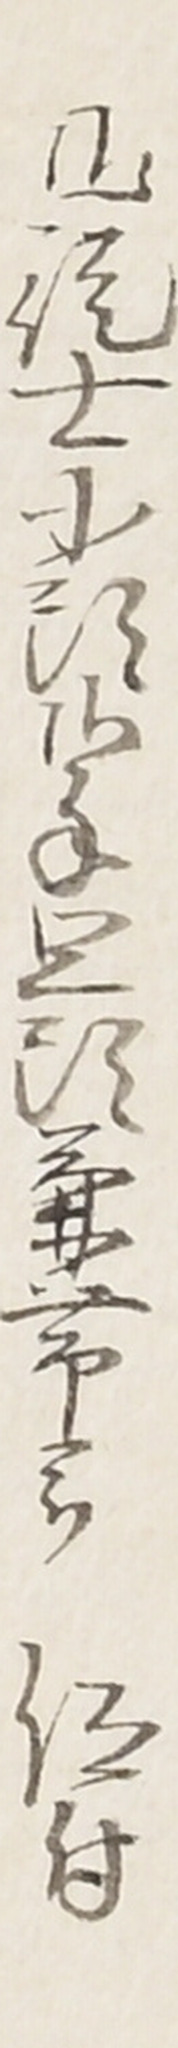御徒士小頭御手廻頭兼帯被仰付

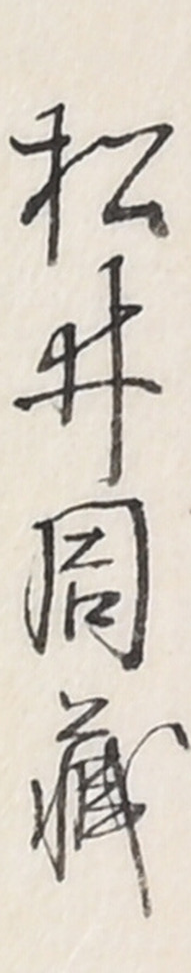松井周藏
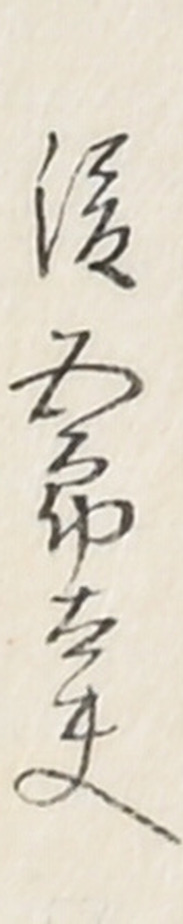後五郎太夫
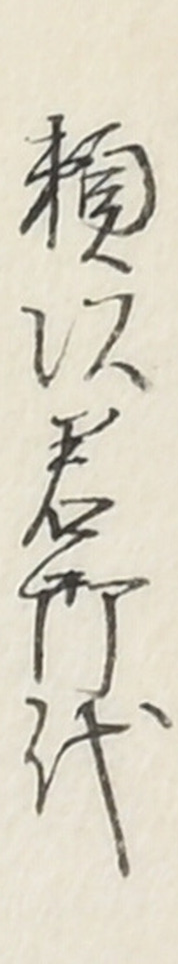頼以君御代
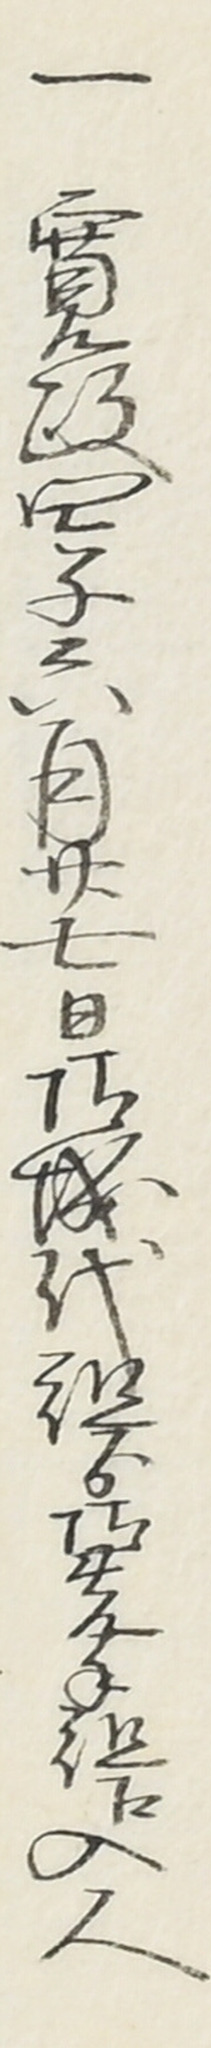一寛政四子六月廿七日御城代組ゟ御先手組江入人
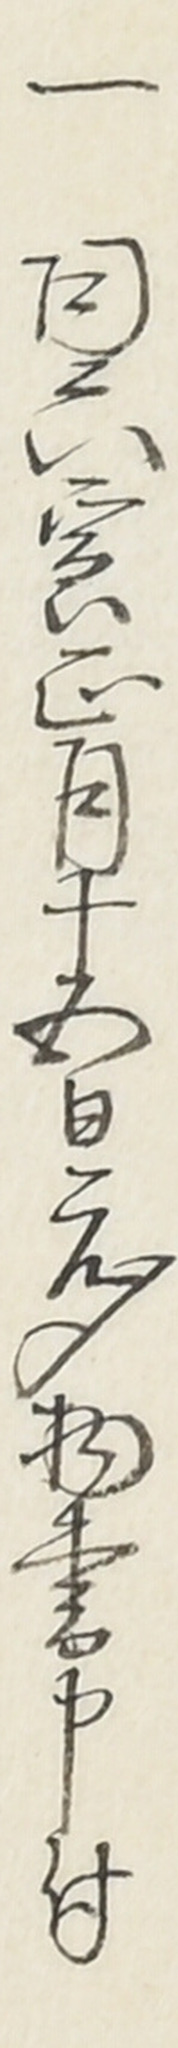一同六寅正月十五日元〆物書申付
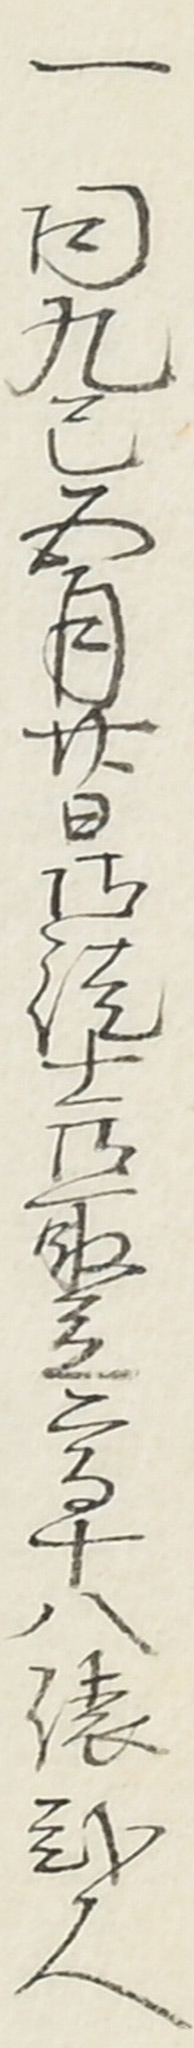一同九巳五月廿日御徒士御取立高十八俵弐人
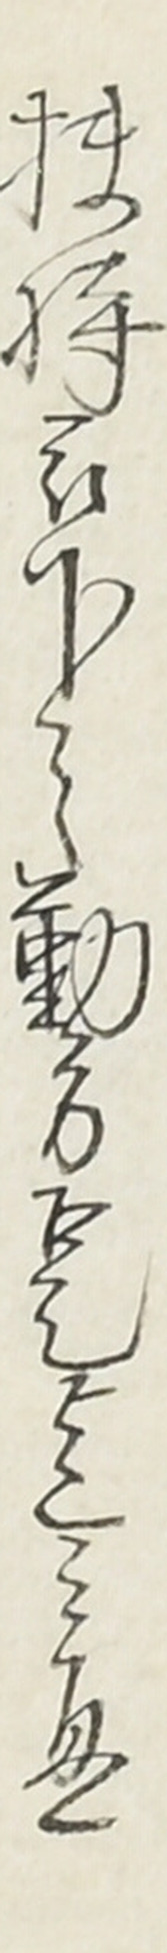扶持被下之勤方是迄之通
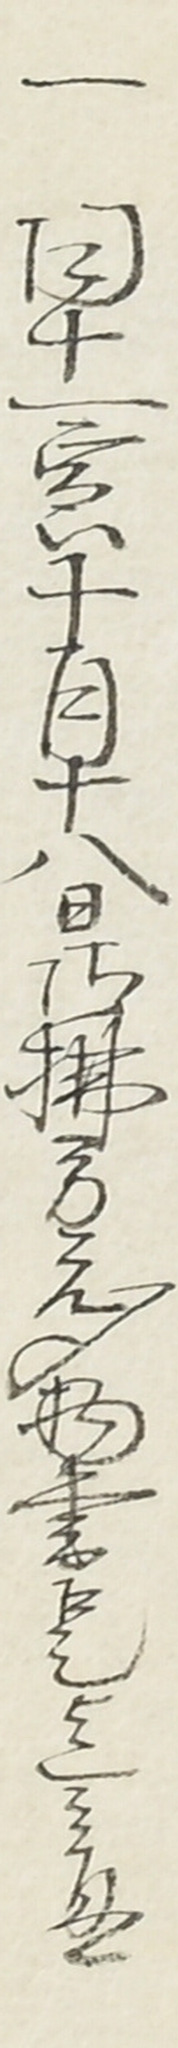一同十一寅十月十八日御払方元〆物書是迄之通
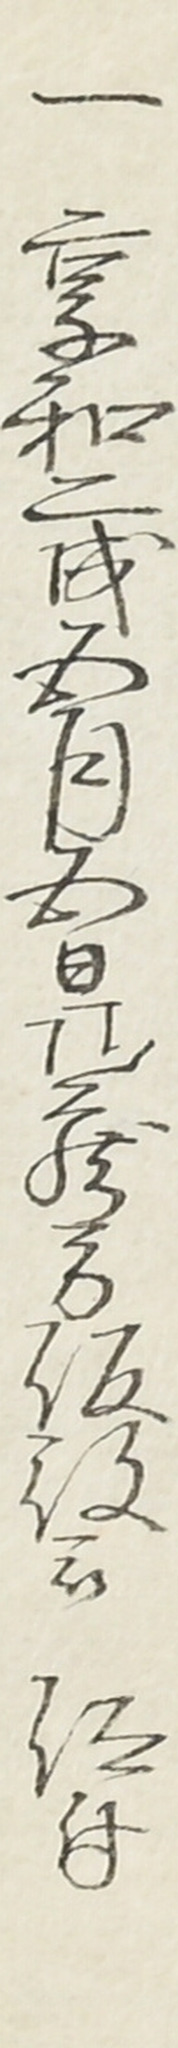一享和二戊五月五日御蔵方仮役被仰付
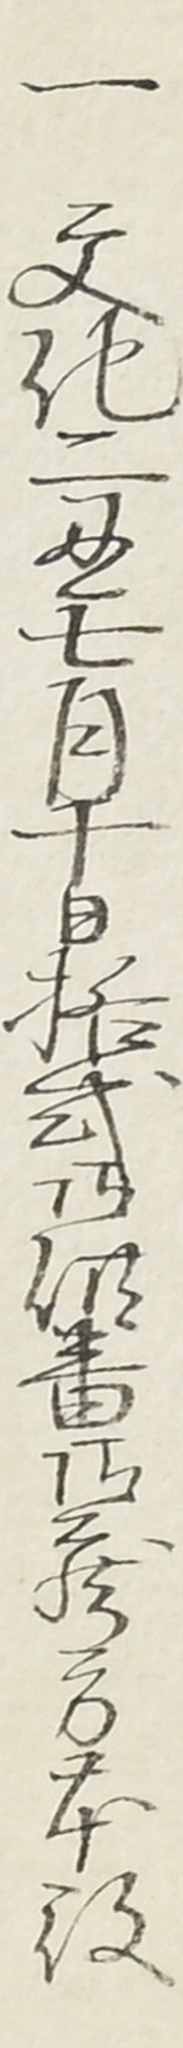一文化二丑七月十日格式御供番御蔵方本役
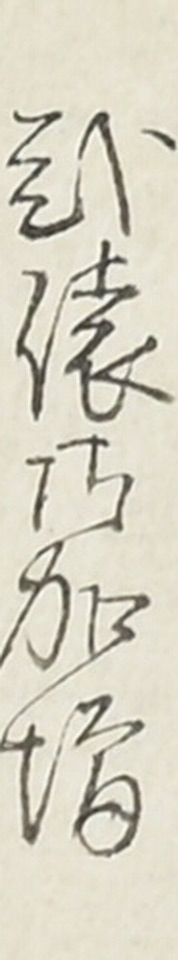弐俵御加増
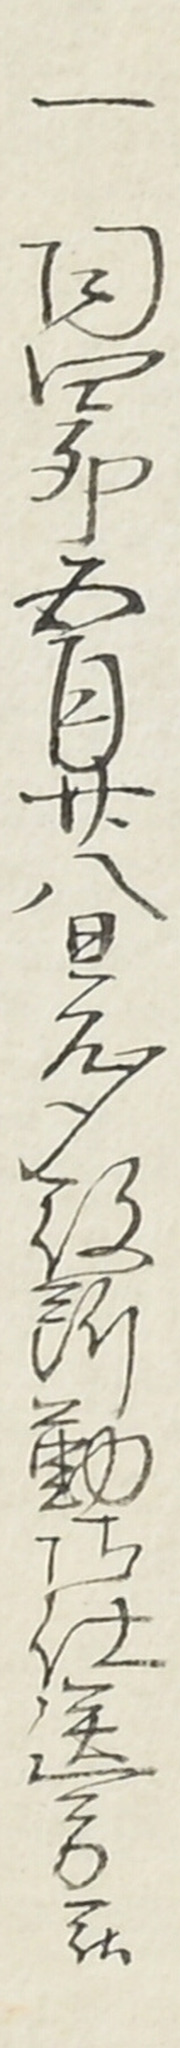一同四卯五月廿八日元〆役所勤御仕送方被
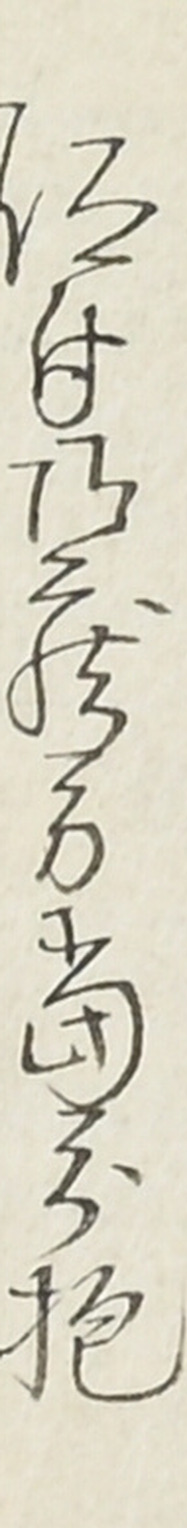仰付御蔵方当分抱
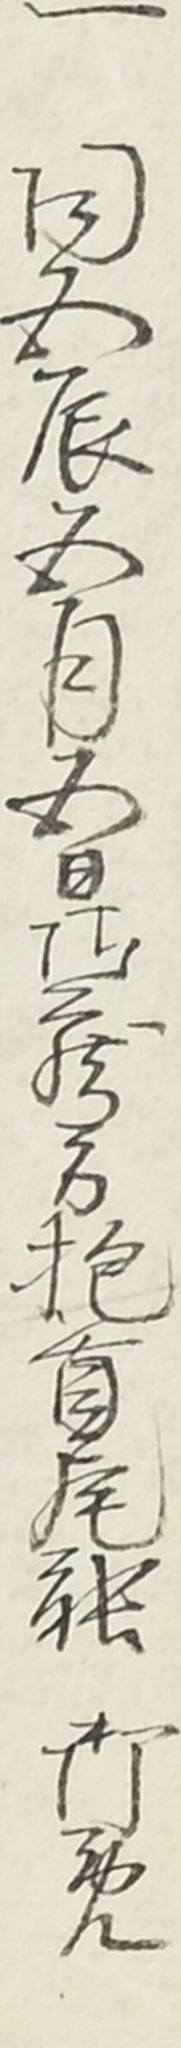一同五辰五月五日御蔵方抱首尾能御免
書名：無足諸士勤仕録（四）
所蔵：伊那市立高遠町図書館・合同会社AMANE
